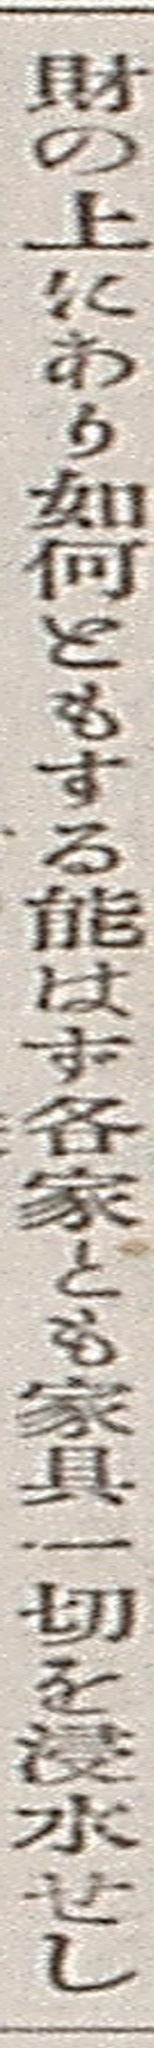財の上にあり如何ともする能はず各家とも家具一切を浸水せし
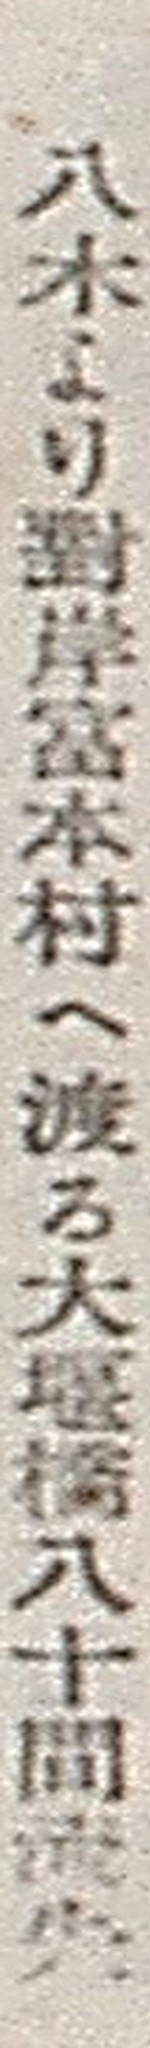八木より対岸富本村へ渡る大堰橋八十間流失
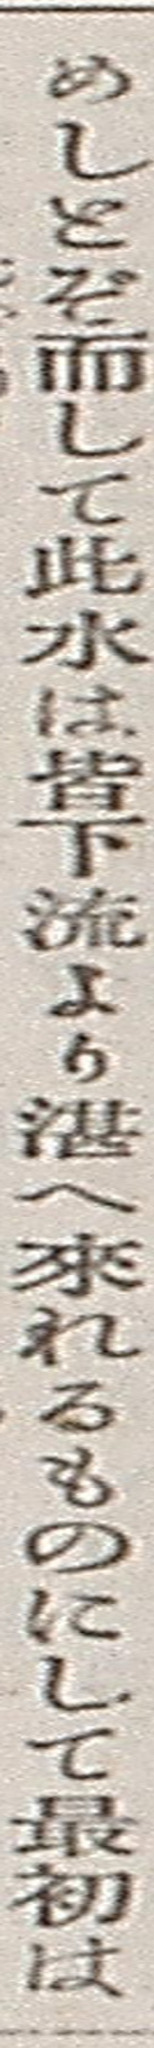めしとぞ而して此水は皆下流より湛へ来れるものにして最初は
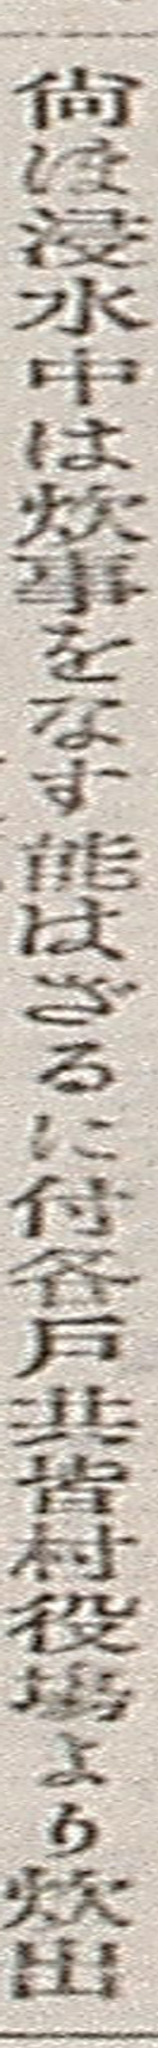尚ほ浸水中は炊事をなす能はざるに付各戸共皆村役場より炊出
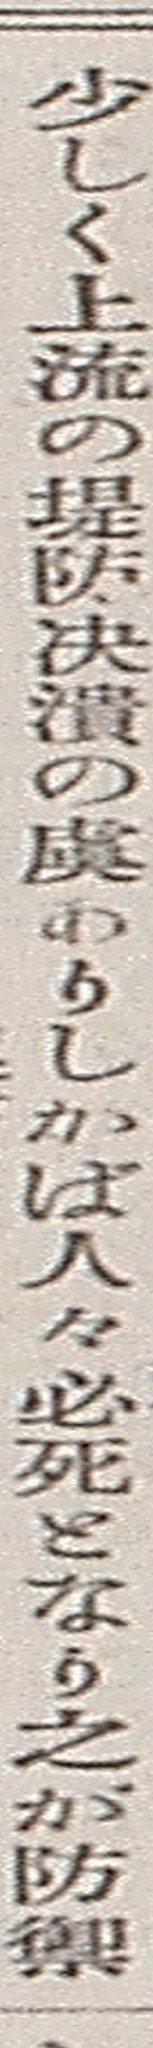少しく上流の堤防决潰の虞ありしかば人々必死となり之が防禦
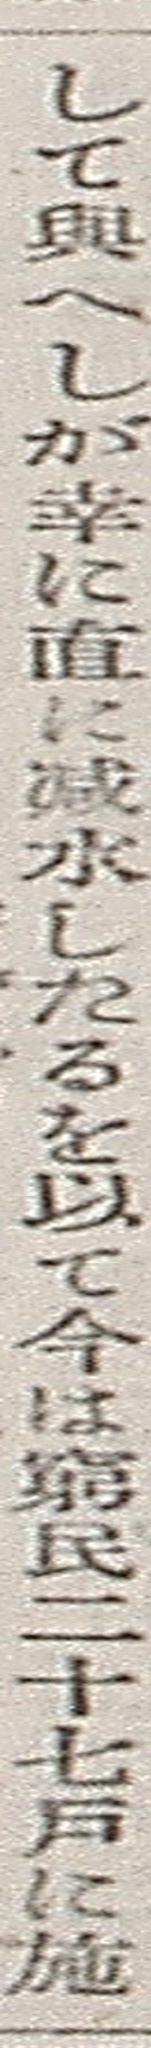して與へしが幸に直に減水したるを以て今は窮民二十七戸に施
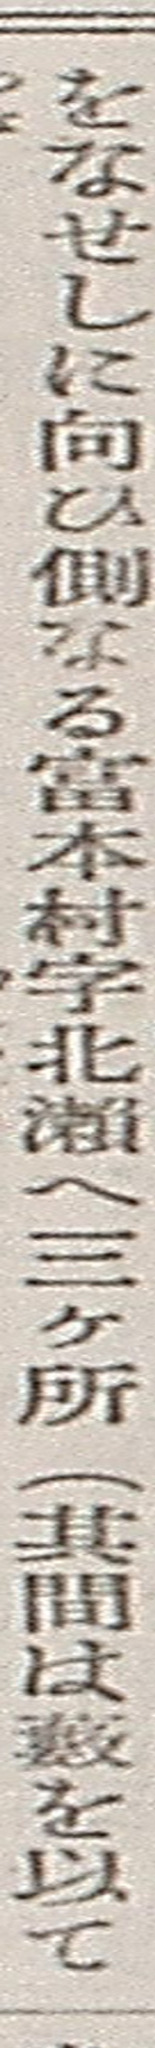をなせしに向ひ側なる富本村字北瀬へ三ヶ所（其間は藪を以て
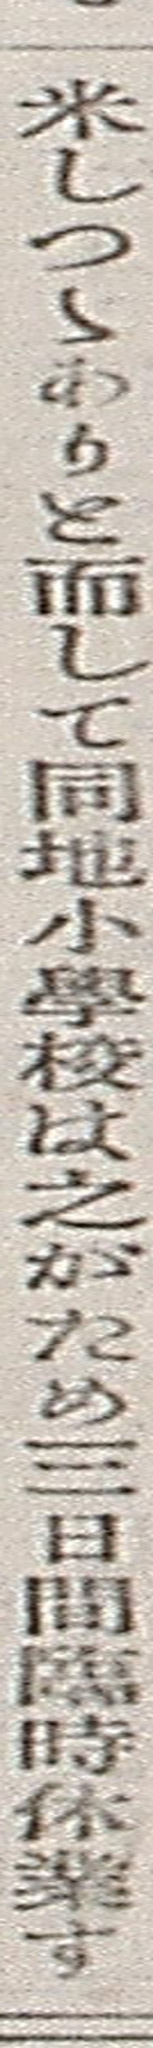米しつゝありと而して同地小学校は之がため三日間臨時休業す
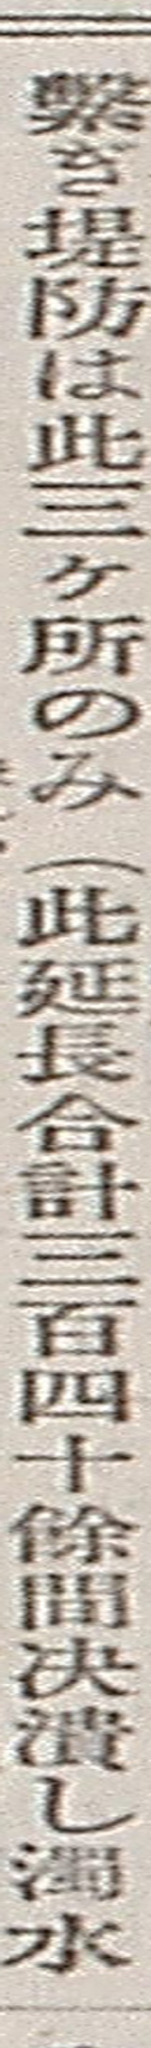繋ぎ堤防は此三ヶ所のみ）此延長合計三百四十餘間决潰し濁水
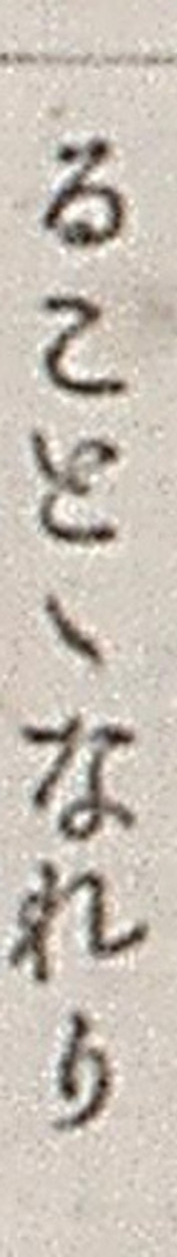ることゝなれり
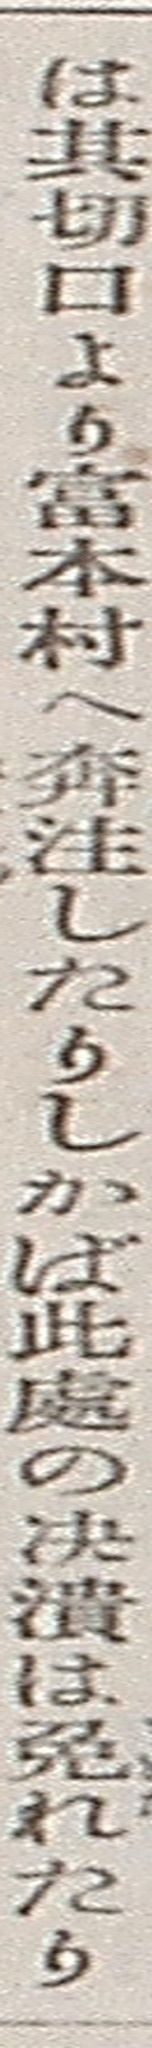は其切口より富本村へ奔注したりしかば此処の决潰は免れたり
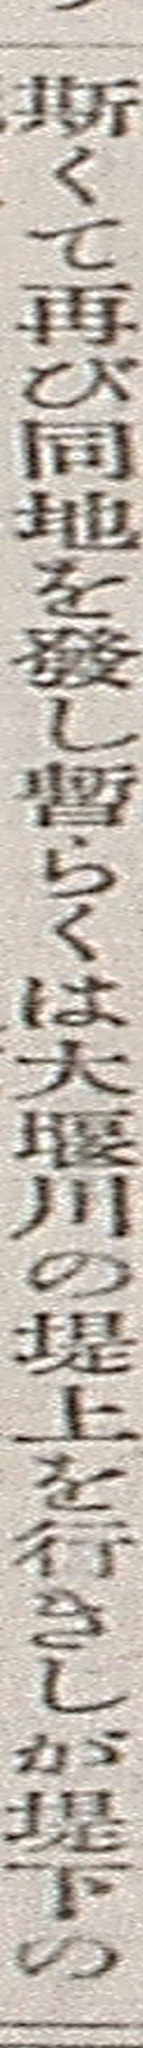斯くて再び同地を発し暫らくは大堰川の堤上を行きしが堤下の
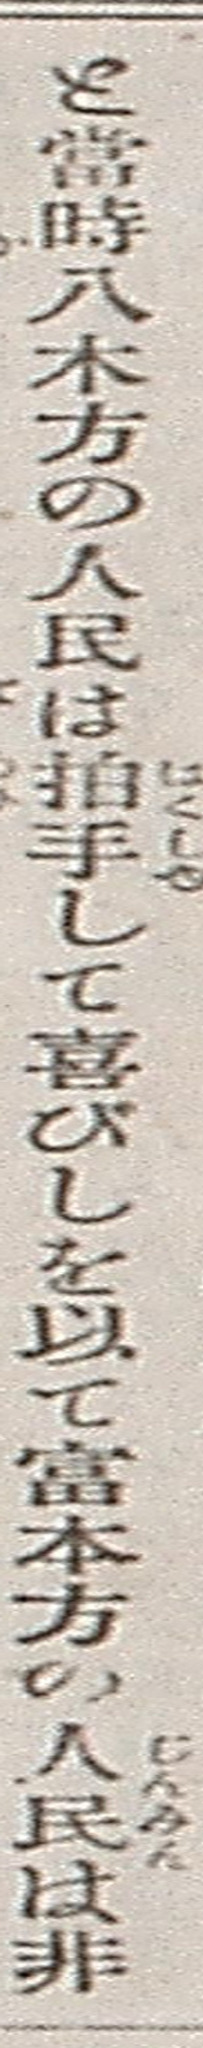と当時八木方の人民は拍手して喜びしを以て富本方の人民は非
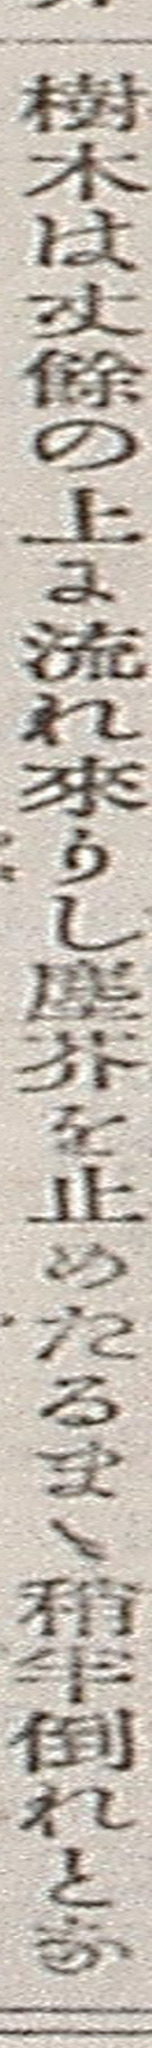樹木は丈餘の上に流れ来りし塵芥を止めたるまゝ稍半倒れとな
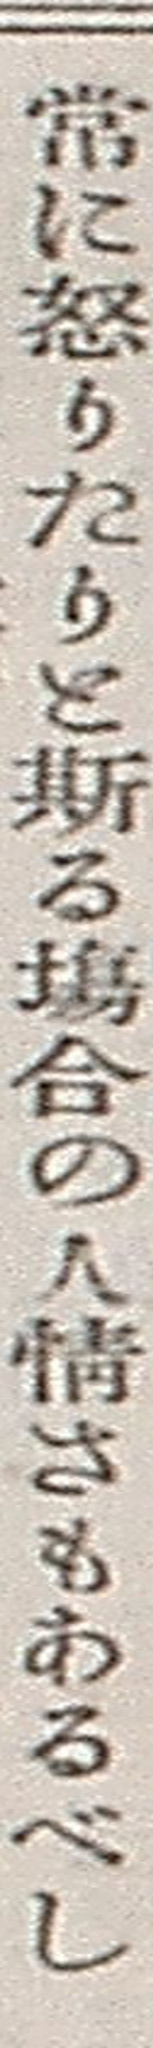常に怒りたりと斯る場合の人情さもあるべし
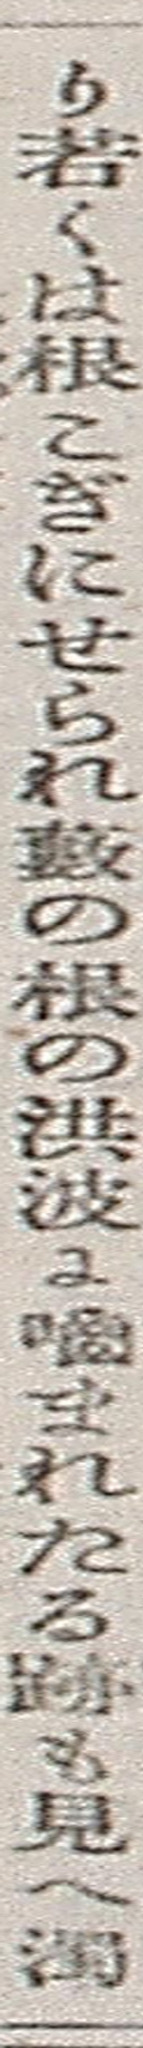り若くは根こぎにせられ藪の根の洪波に嚙まれたる跡も見ㇸ濁
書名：風俗畫報臨時増刊第百二十六號　洪水被害録（中）
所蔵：東京大学地震研究所図書室 Earthquake Research Institute Library, The University of Tokyo, JAPAN
